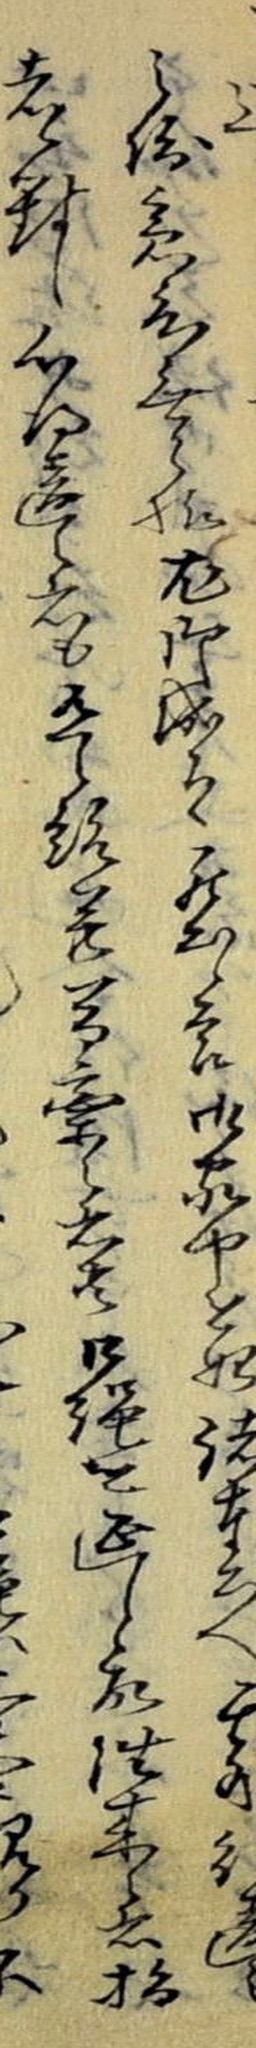者へ対し心得違之者も有之趣并馬牽之者共口縄を延し候故往来之者指
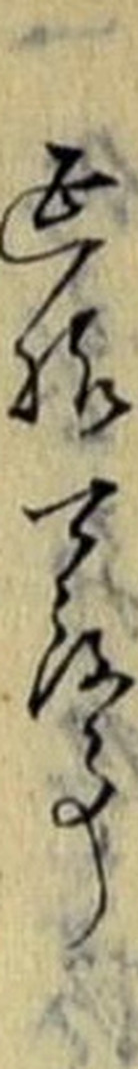延様可致事
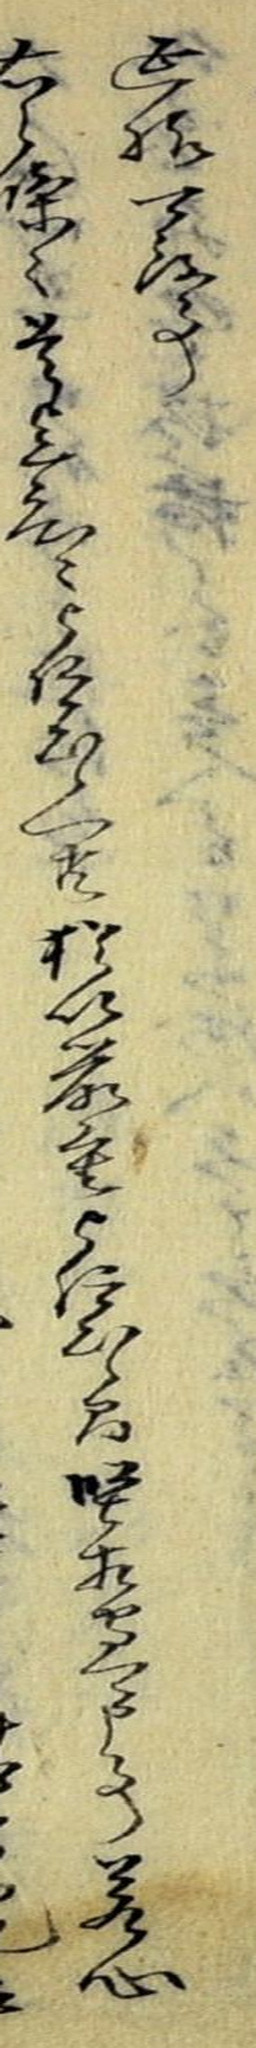右之條々是迄度々被仰出候へ共猶以厳重被仰出候間堅相守可申事若心
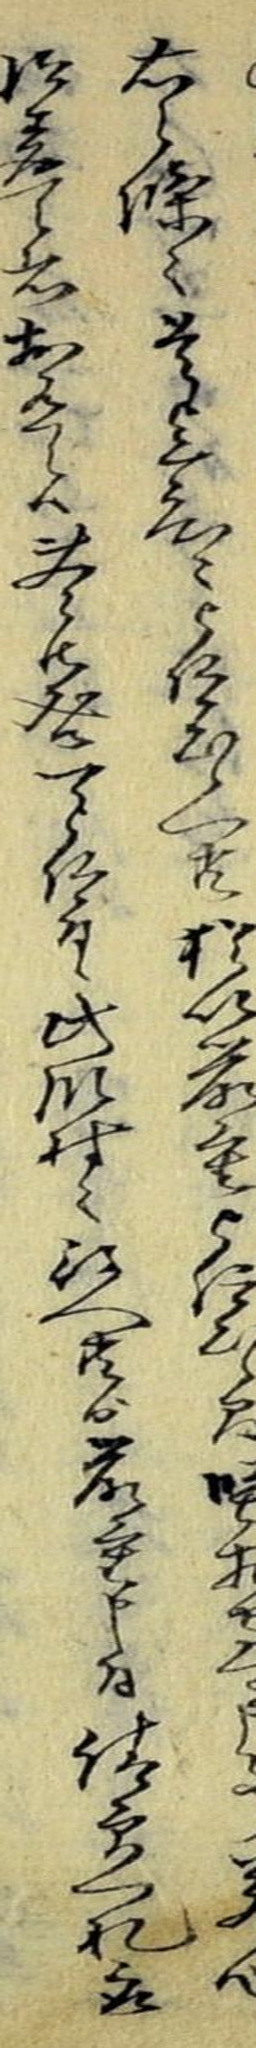得違之者於有之は夫々御咎可被仰付候此段村々役人共ゟ厳重申付請印一札取
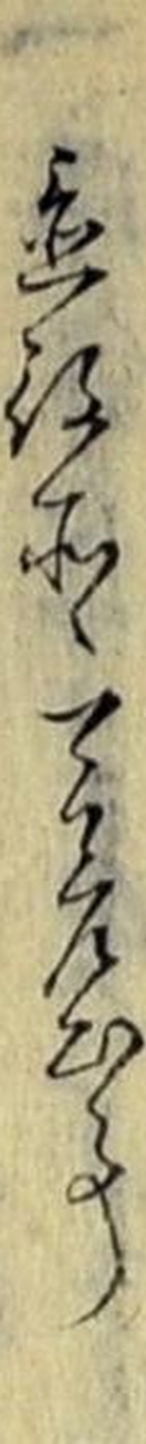置役所へ可差出事
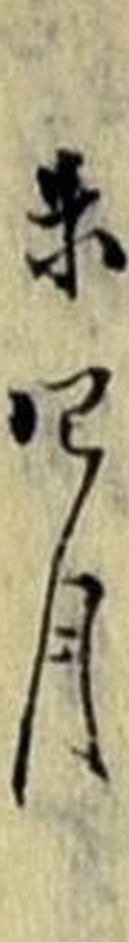未四月
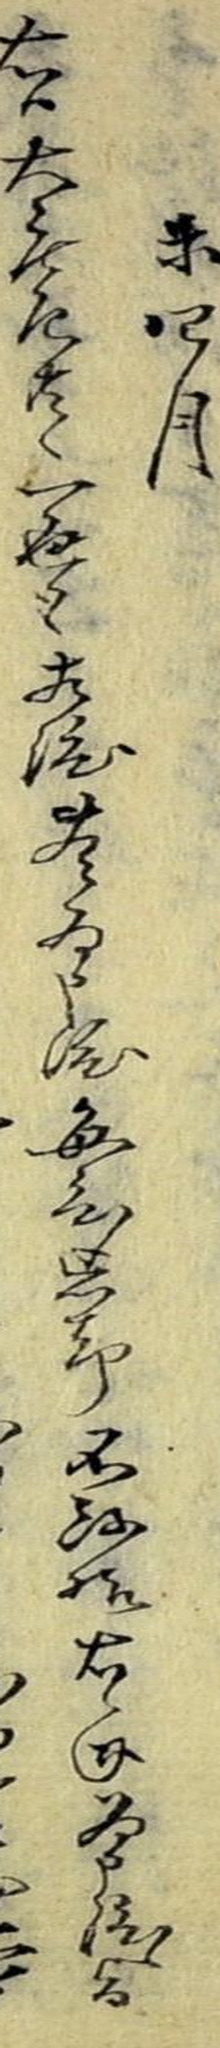右は大庄屋共へ一通つヽ相渡夫々為申渡毎度忘却不致様右之趣為申渡候旨
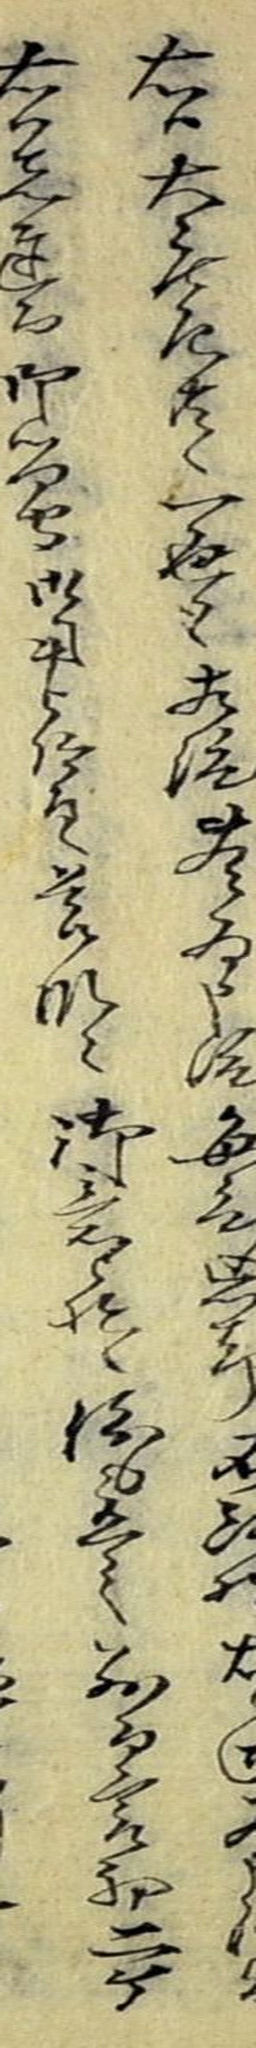右は先達而御留守御用被仰付候節段々御意被遊候儀も有之別而最初二ヶ
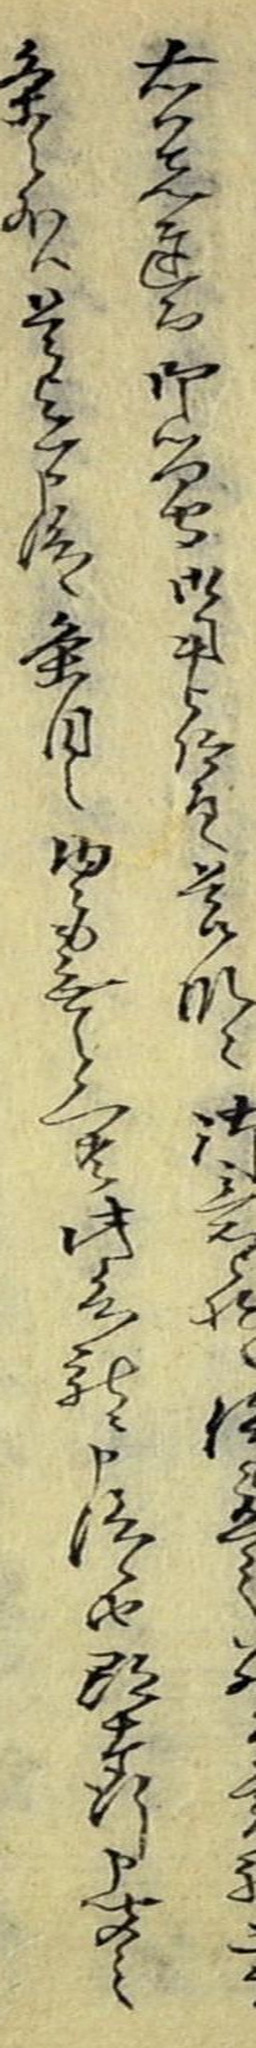条之外は是迄申渡候条目之内にも無之候へ共此度新に申渡候由郡奉行申聞之
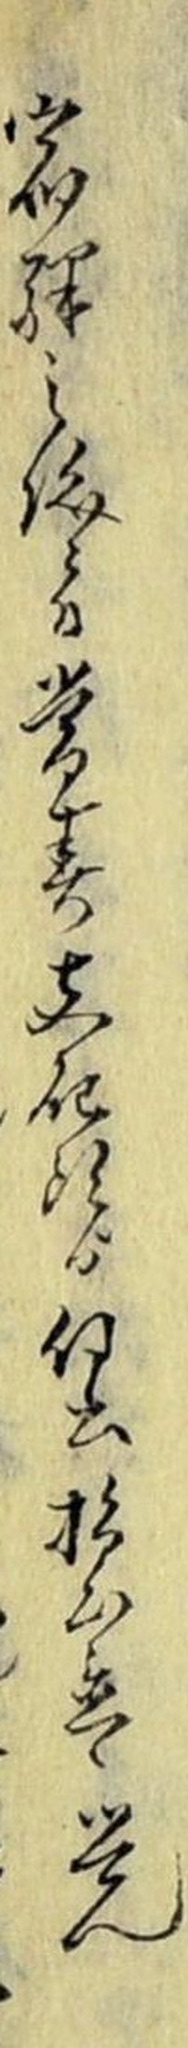宿駅之儀に付当春支配頭ゟ伺書指出置候覚
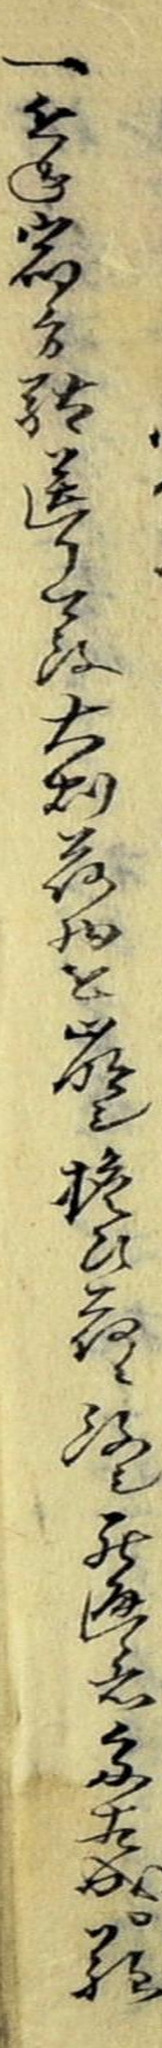一近年宿方駄送り可致大判荷物を崩し担ひ荷に致し罷通候者多相成。宿益薄罷成難

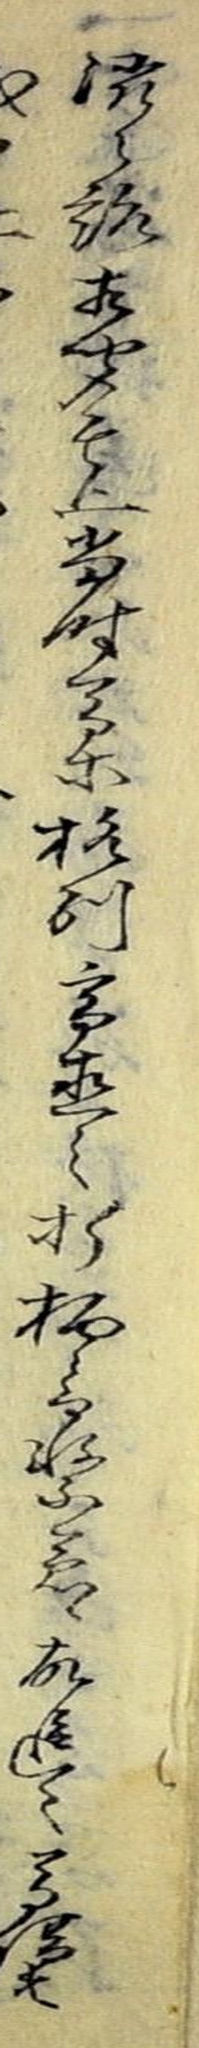澁之趣相聞其上当時馬等格別高直之折柄に而繋兼候故追々馬借共
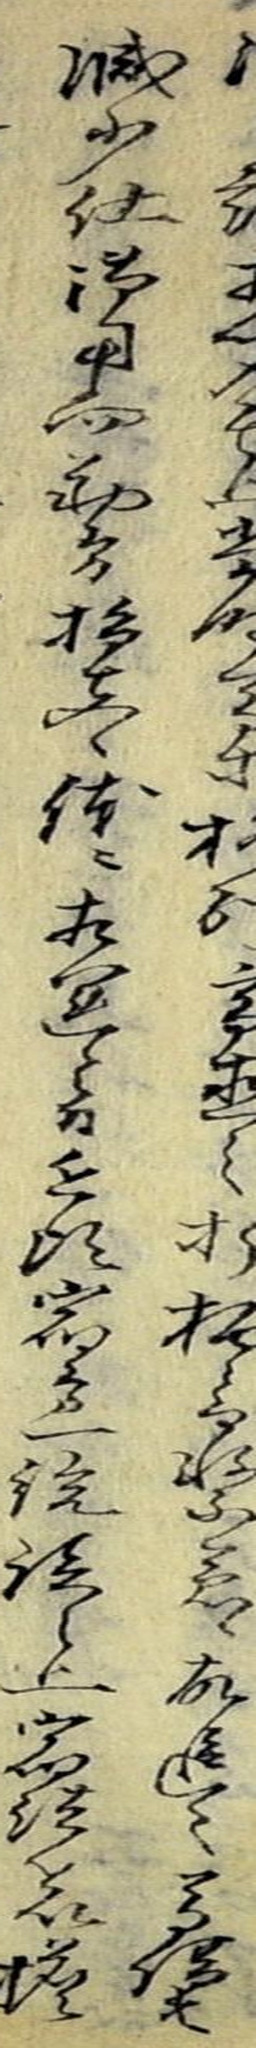減少仕御用向勤方指支候体に相運候に付近頃宿方一統談之上宿法を以担
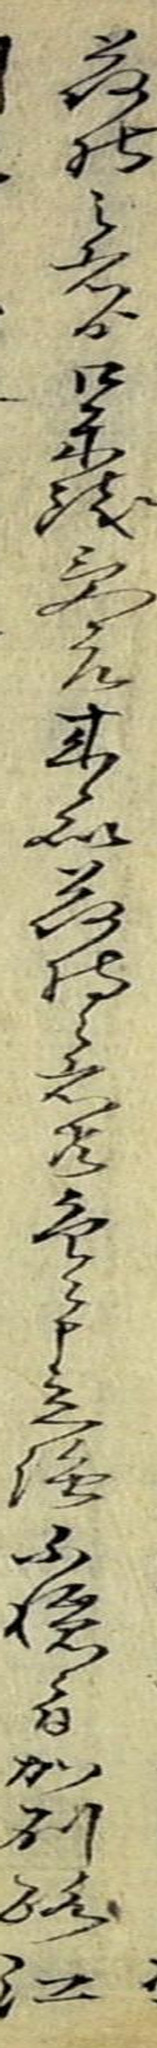荷持之者ゟ口永銭受取来候処荷持之者共色々申立強不穏に付加州路江
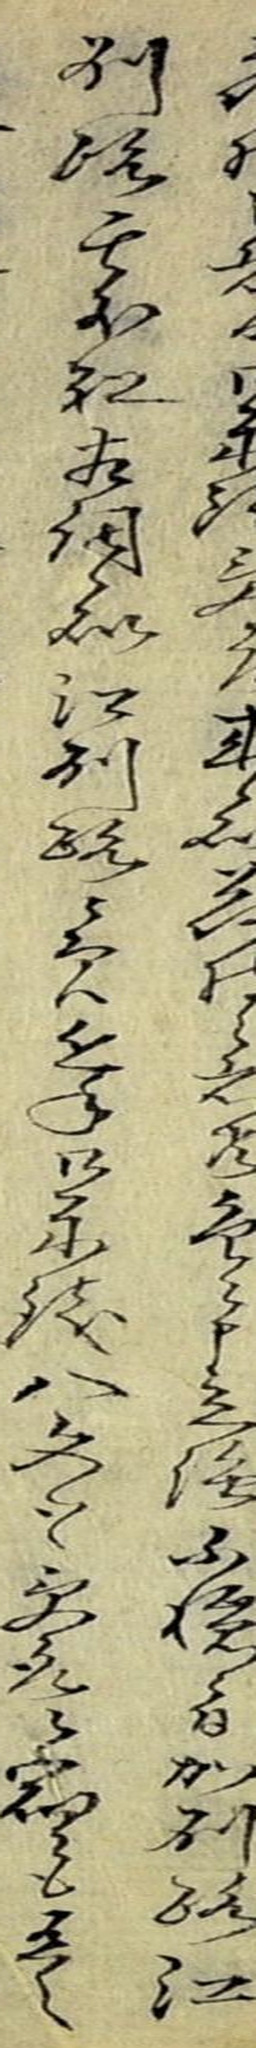州路其外粗相調候処江州路に而は近年口永銭八文つヽ受取候宿々も有之
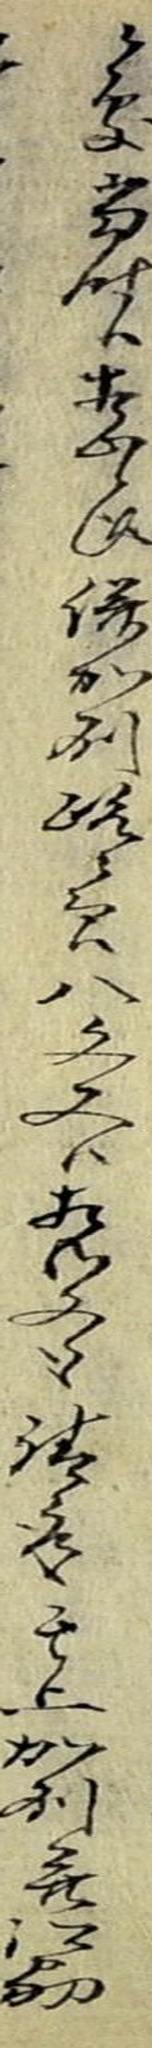候処当時は相止候趣併加州路に而は八文又は拾弐文つヽ請取候其上加州并江州
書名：命令之部 六
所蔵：福井県文書館 Fukui Prefectural Archives
